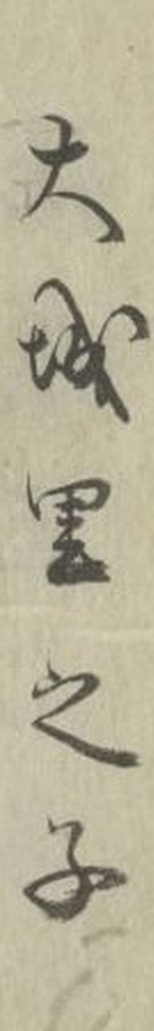韻鑼大城里之子

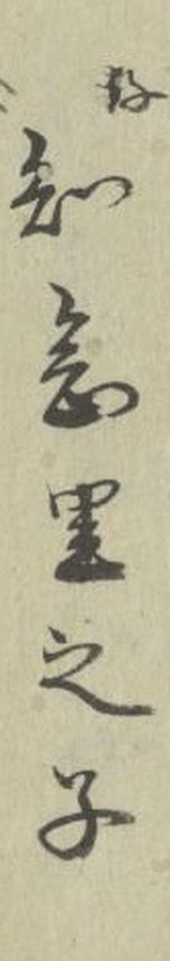三線知念里之子
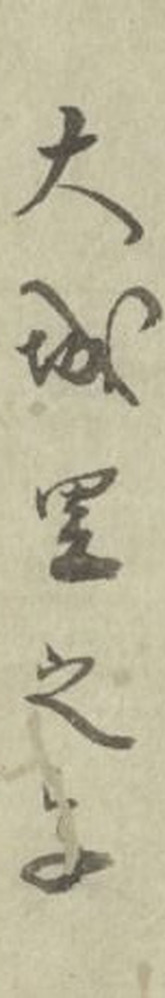同大城里之子

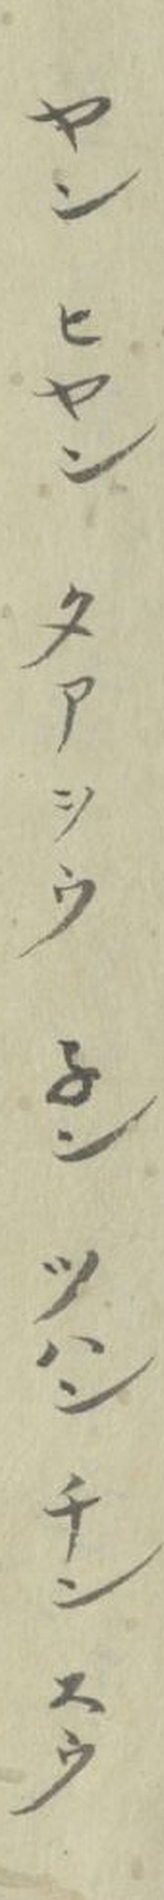ヤンヒヤンタアヲウネンツハンチンスウ
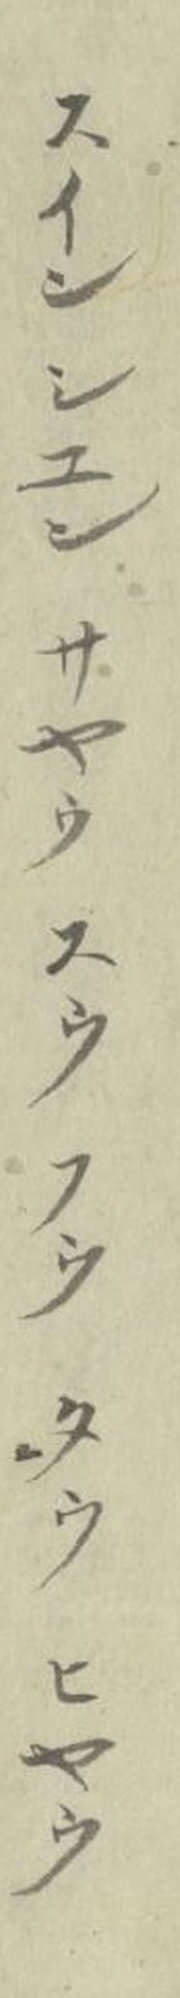スインシユンサヤウスウフウタウヒヤウ
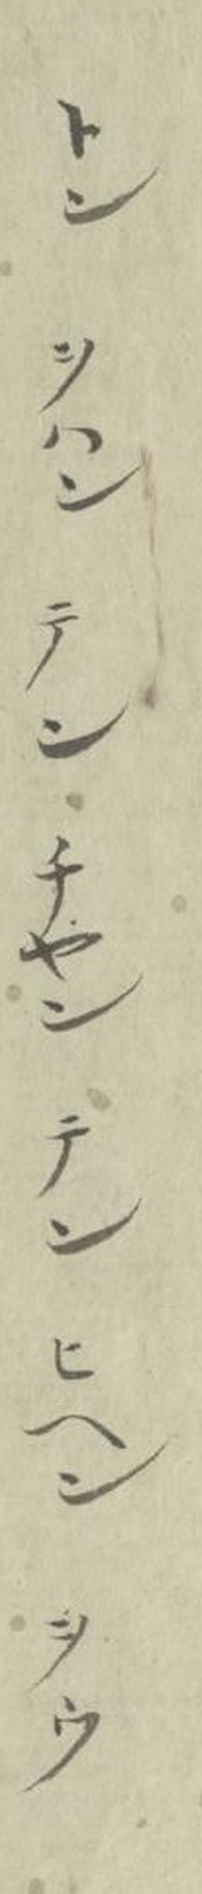トンヲハンテンチヤンテンヒヘンヲウ
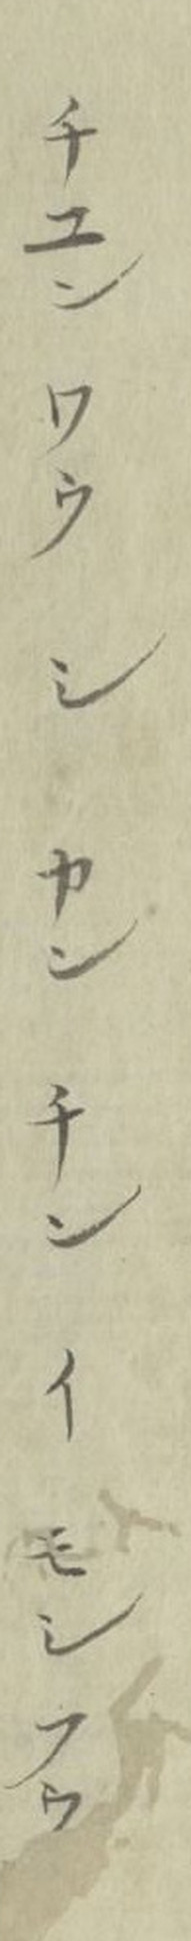チユンワウシカンチンイモシフウ

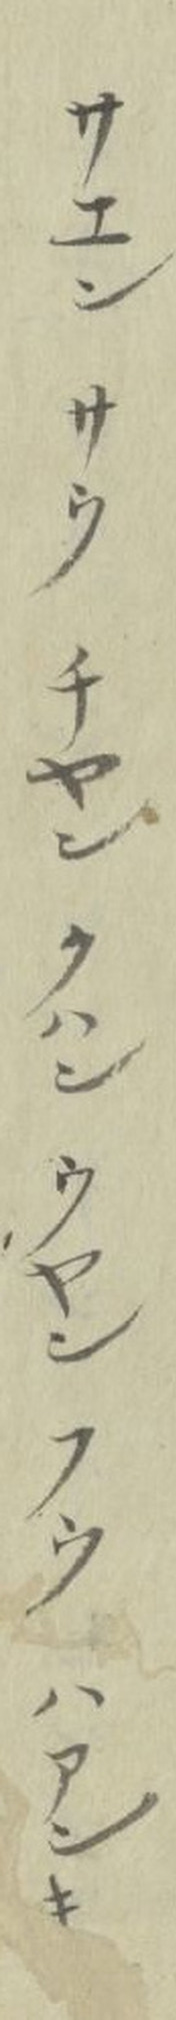サエンサウチヤンクハンウヤンフウハアンキ
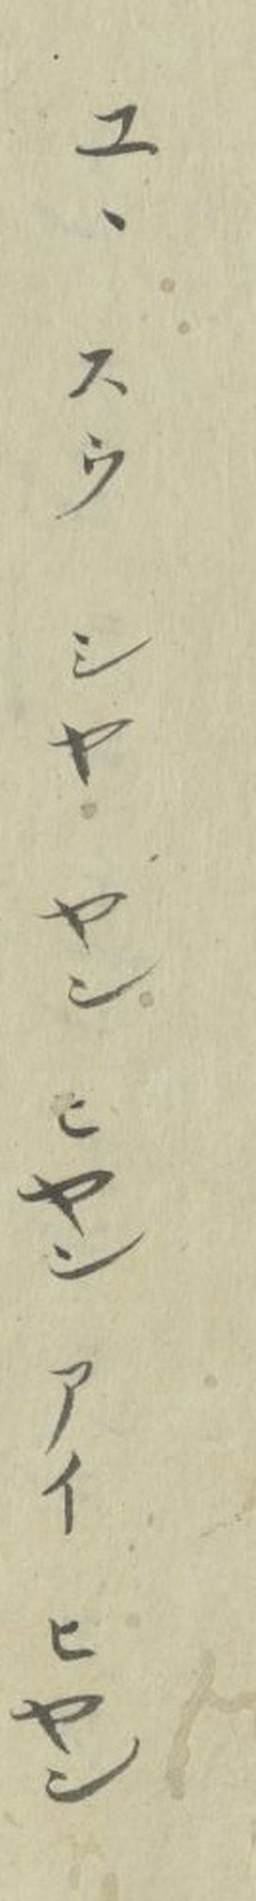ユヽスウシヤヤンヒヤンアイヒヤン
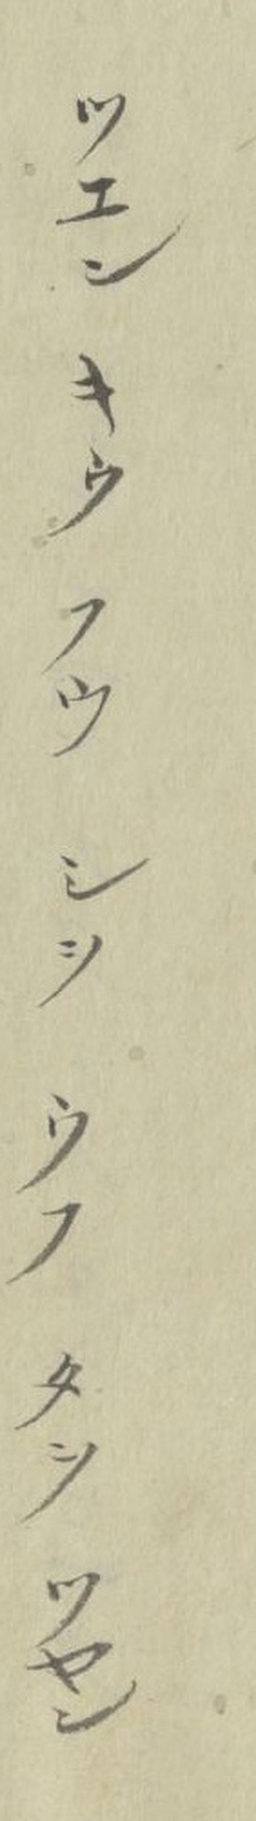ツエンキウフウシヲウフタヲツヤン
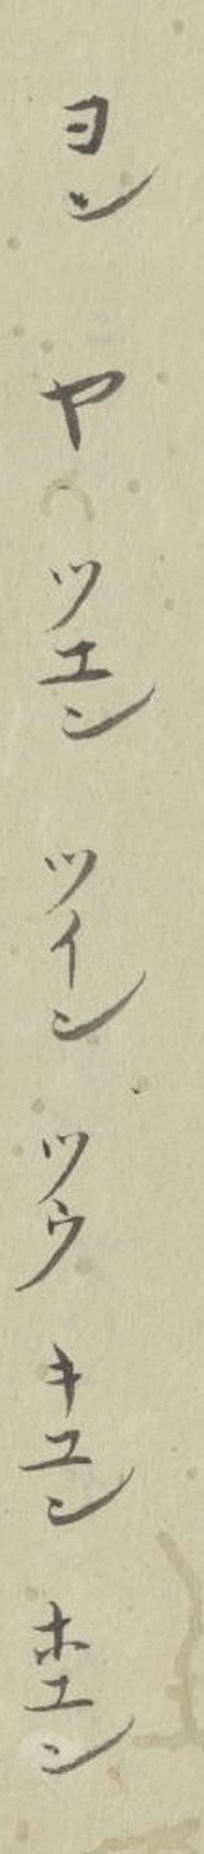ヨンヤツエンツインツウキユンホユン
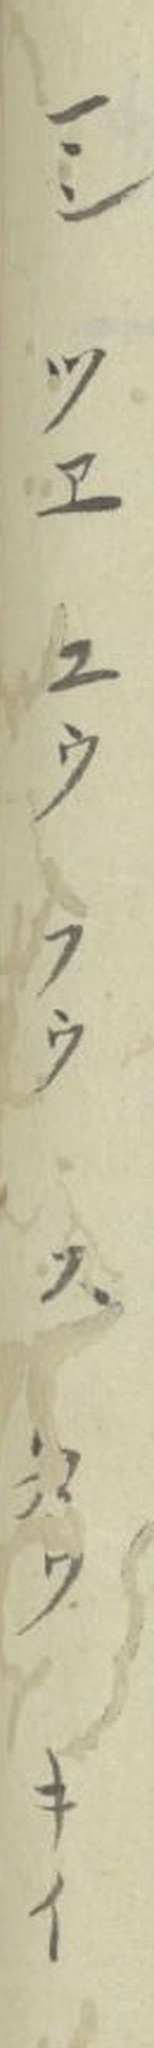マンツヱユウフウスタウキイ
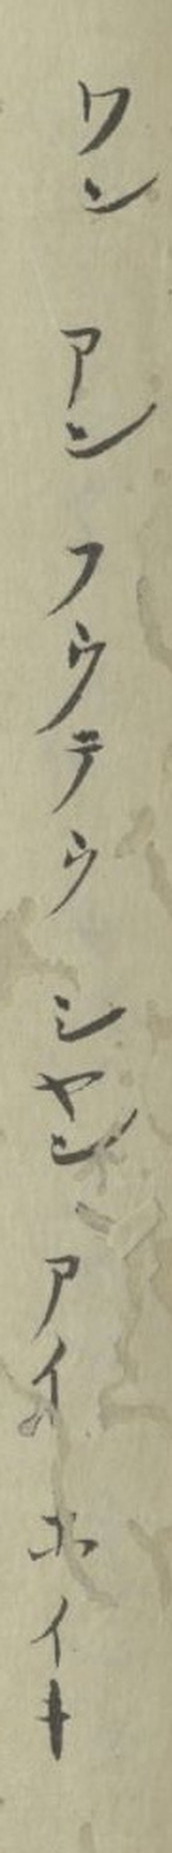ワンアンフウテウシヤンアイホイキ
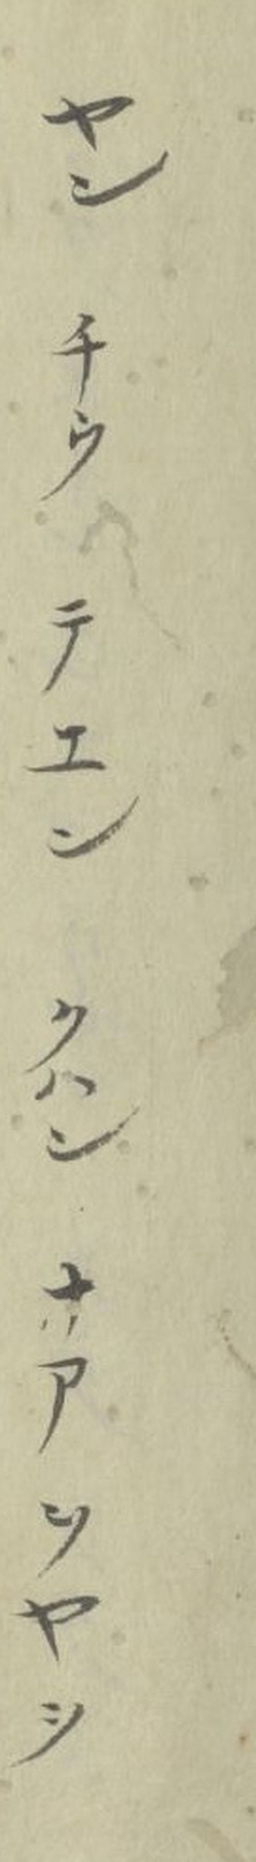ヤンチウテエンクハンナアヲヤヲ
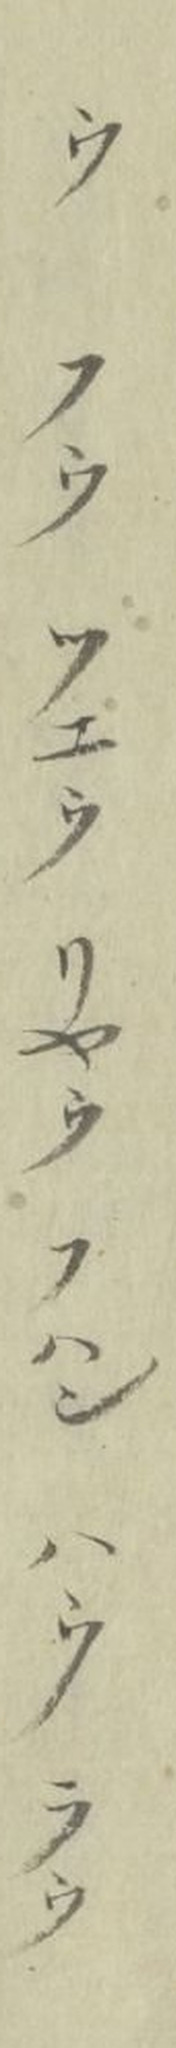ウフウツエウリヤウフハンハウラウ
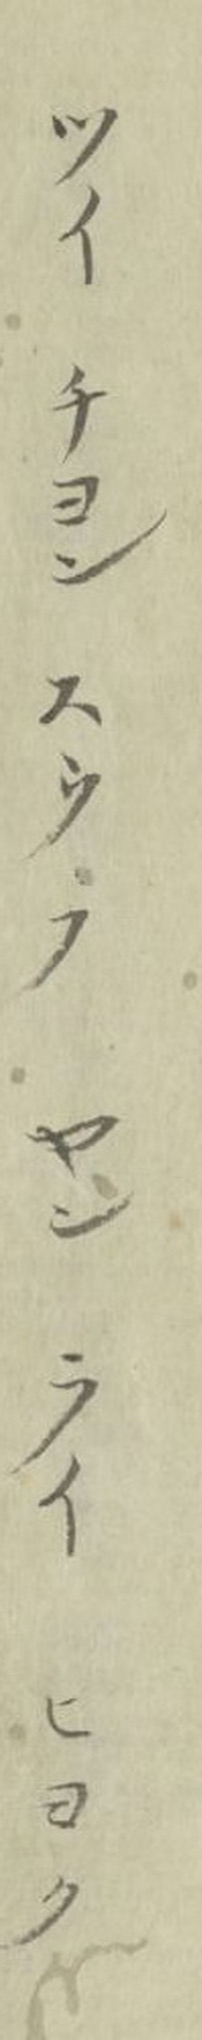ツイチヨンスウフヤンライヒヨク
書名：琉球来朝記 自八至十四終
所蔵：University of the Ryukyus Library
